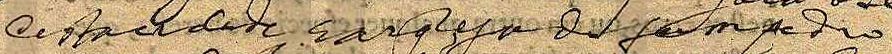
desta cidade e a igreja de Sam pedro
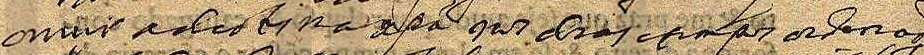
ouuir a doutrina xpã nos dias e tempos ordenado
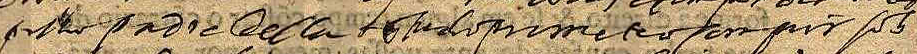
pello padre della q̄ tudo prometeo comprir sob
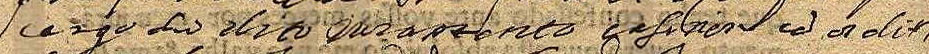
cargo do dito juramento e asinei cō os ditos
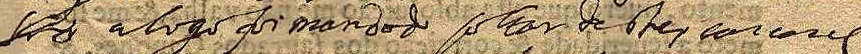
Snrs e logo foi mandado soltar destes carceres
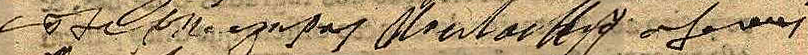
e q̄ se fosse em pas Niculau Nigr o screvi
